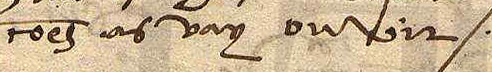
ções as vay ouvir /.
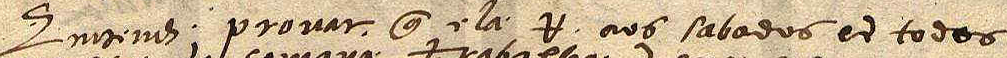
Emtend. prouar q̄ ela. R. aos sabados e ē todos
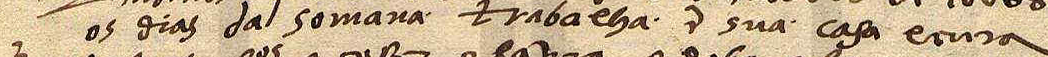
3 os dias da somana. trabalha. ē sua. casa e cura
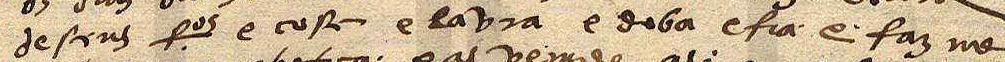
de seus fos e cose e lavra e doba e fia. e faz me
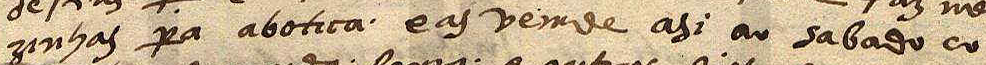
zinhas ꝑa a botica. e as vemde asi ao sabado co
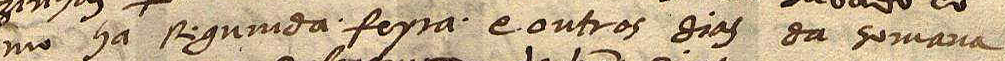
mo ha segunda feyra e outros dias da somana
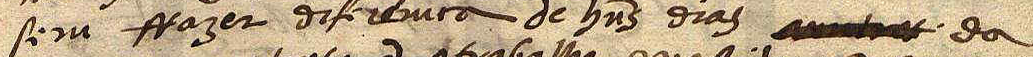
sem ffazer diferença de hūs dias a outros da
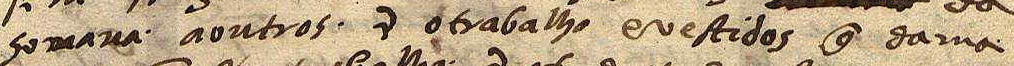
somana a outros. ē o trabalho e vestidos q̄ da ma
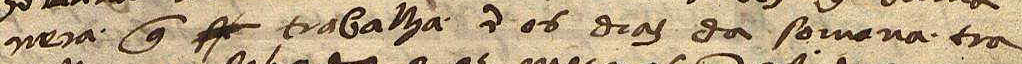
nera. q̄ se trabalha. ē os dias da somana. tra
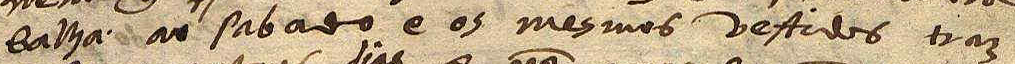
balha. ao sabado e os mesmos vestidos traz
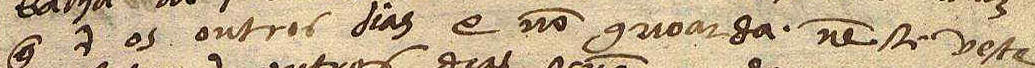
q̄ ē os outros dias e n̄o guoarda. n̄e se veste
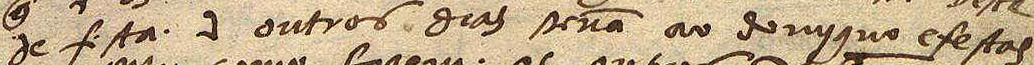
de festa. ē outros dias sen̄a ao domjguo e festas
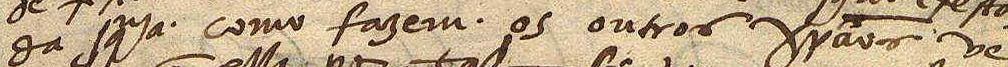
da Jḡja. como fazem os outros xpãos ve
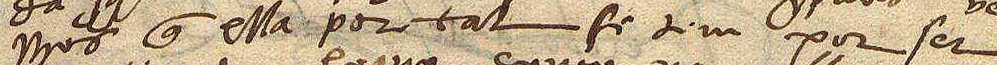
lhos q̄ ella por tal se tem por ser
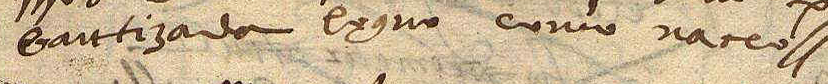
bautizada loguo como naceo //
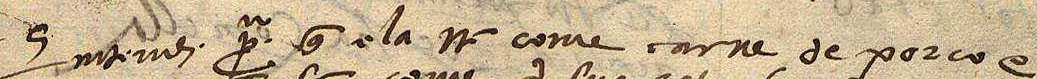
Emtemd ꝓ̄. q̄ ela rre come carne de porco e
